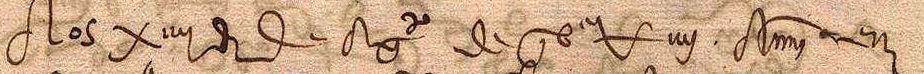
Aos Xiiij di de Agto de j̄ bc Riiij . Annꝯ em
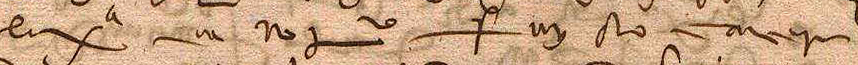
liXa eu notro fuy Ao carcere
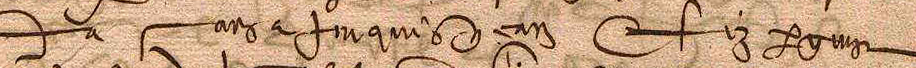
da santa Jmquisyçam e fiz ꝑgunta
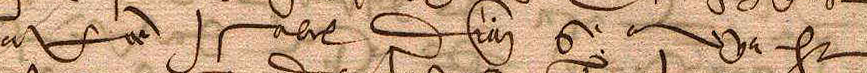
a Ree Jsabel diaz se avya ha
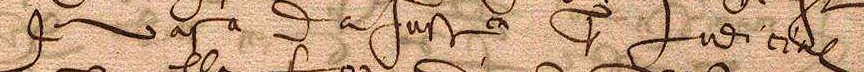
devasa da Justça p̄o Judicial
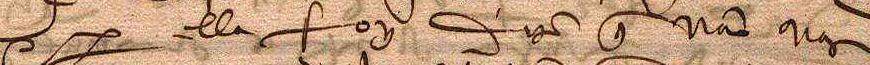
e ꝑ ella foy dito q̄ não nas
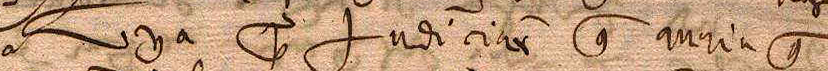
avya p̄o Judiciaes q̄ queria q̄
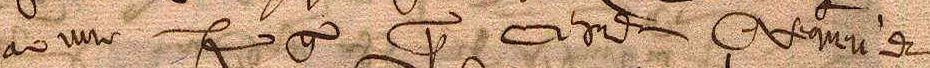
a ouue logo p̄o çitada e Requerida
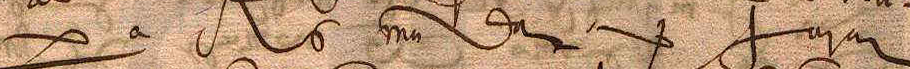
ꝑa As mādar ꝟ Jurar
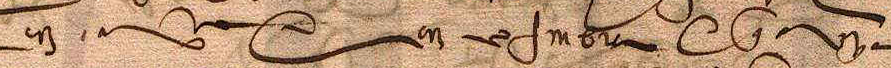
em avro e em coJmbra e q̄ avya
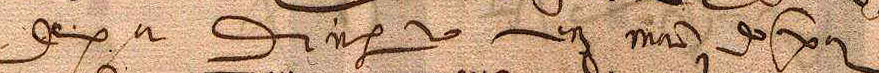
de por dinhro em maõ do p̄or
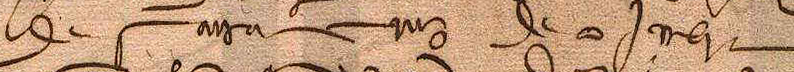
de santa cruz de coJmbra
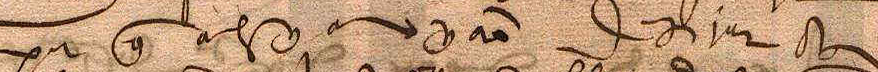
porq̄ ahy avyaõ de tirar As
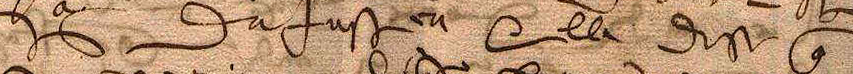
tas da Justca e ella dise q̄
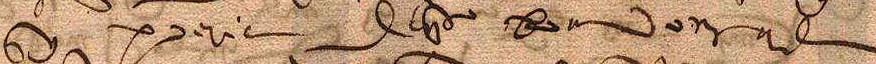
sy poeria de mto boa vontade
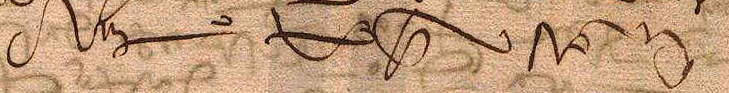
Anto Roj̄z o spvy
